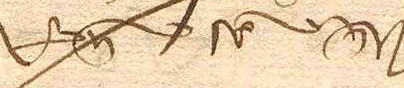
Roj̄z o spr̄vy
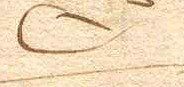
Co
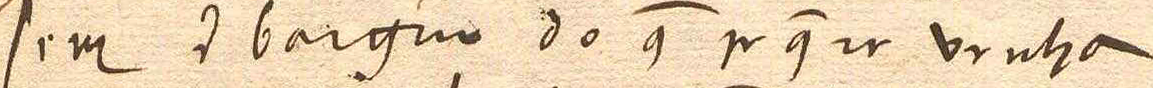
sem ēbarguo do q̄ req̄re venha
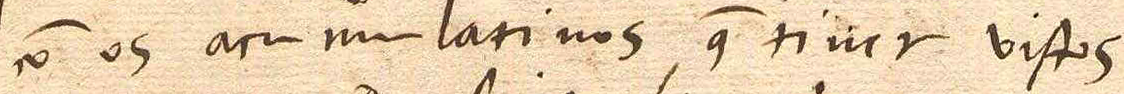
cō os acumulatiuos q̄ tiuer vistos
